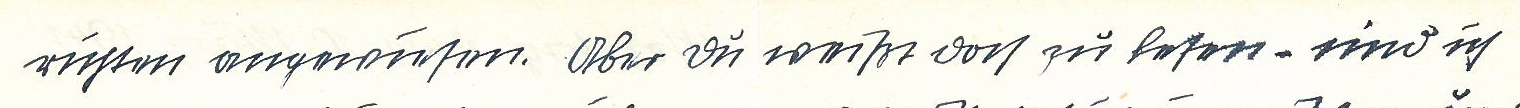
richten angewiesen. Aber Du weißt doch zu lesen – und ich
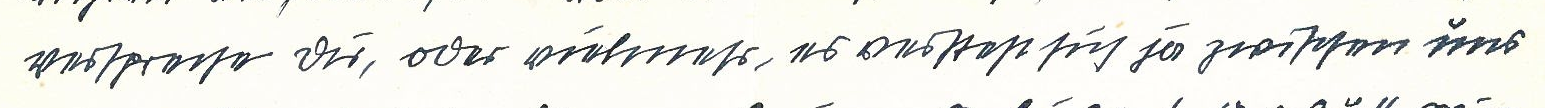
verspreche Dir, oder vielmehr, es versteht sich ja zwischen uns
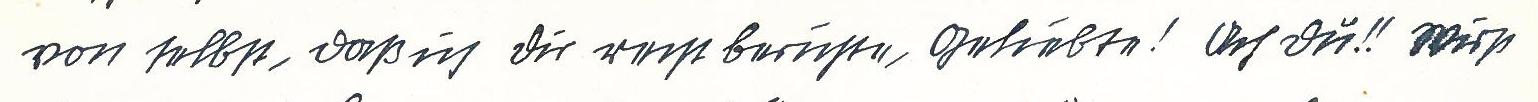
von selbst, daß ich Dir recht berichte, Geliebte! Ach Du!! Wirst
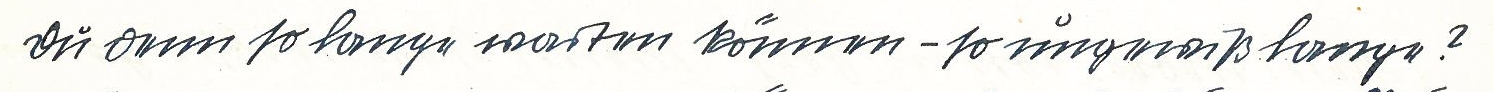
Du denn so lange warten können – so ungewiß lange?
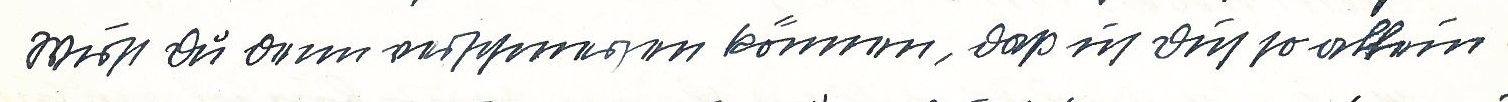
Wirst Du denn verschmerzen können, daß ich Dich so allein
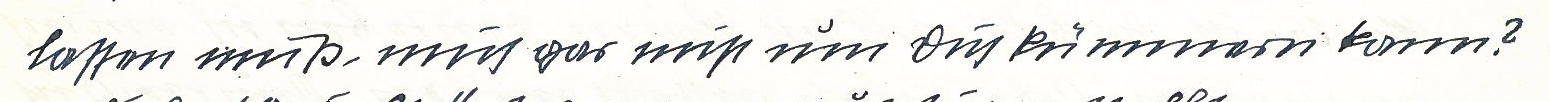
lassen muß, mich gar nicht um Dich kümmern kann?
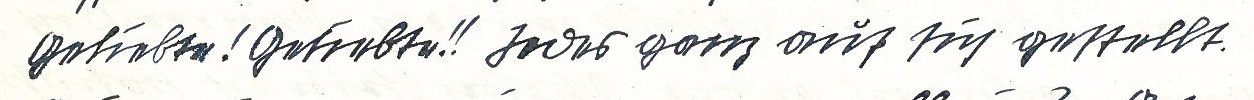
Geliebte! Geliebte!! Jeder ganz auf sich gestellt.
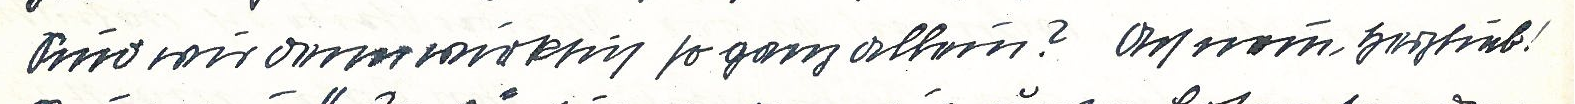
Sind wir denn wirklich so ganz allein? Ach nein, Herzlieb!
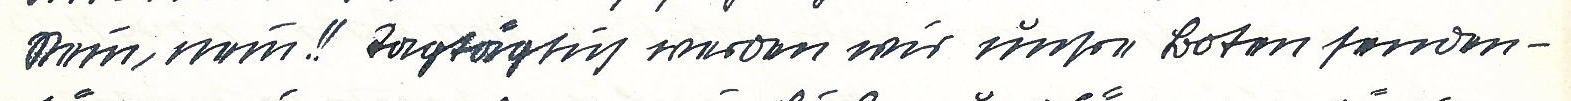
Nein, nein! Tagtäglich werden wir unsre Boten senden –
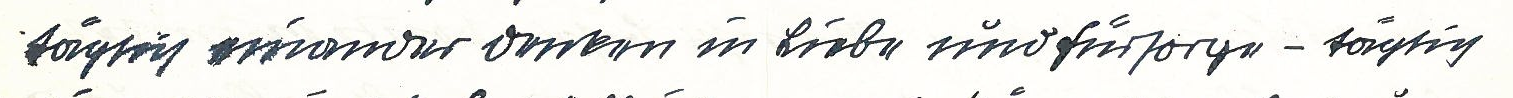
täglich einander denken in Liebe und Fürsorge – täglich
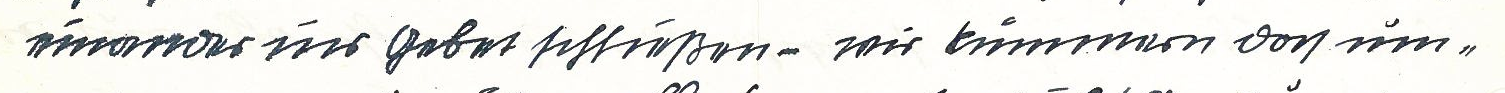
einander ins Gebet schließen – wir kümmern doch um¬
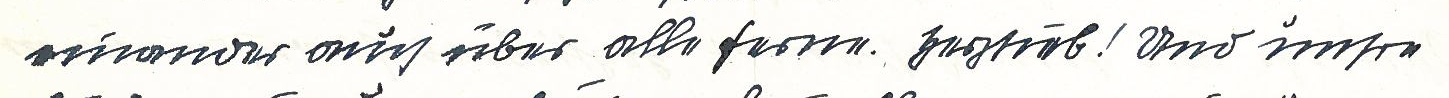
einander auch über alle Ferne. Herzlieb! Und unsre
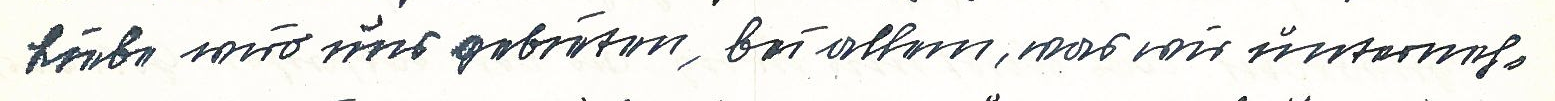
Liebe wird uns gebieten, bei allem was wir unterneh¬
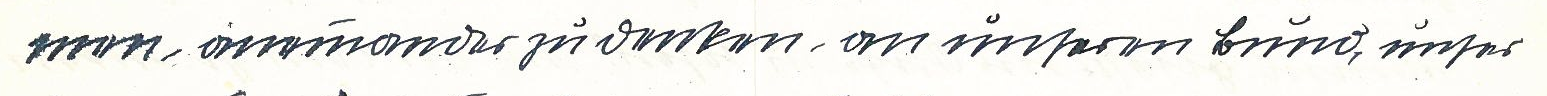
men, einander zu denken, an unseren Bund, unser
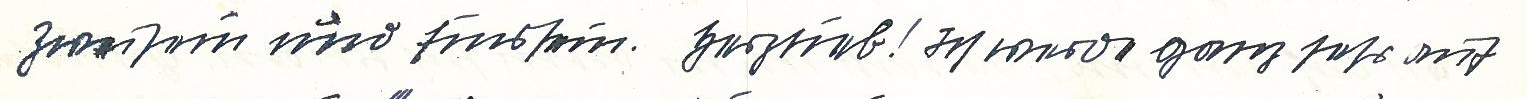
Zweisein und Einssein. Herzlieb! Ich werde ganz sehr auf
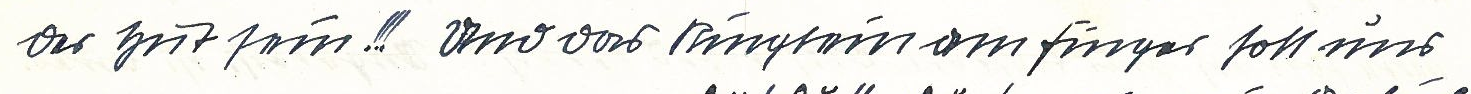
der Hut sein!! Und das Ringlein am Finger soll uns
